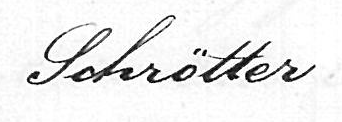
Schrötter
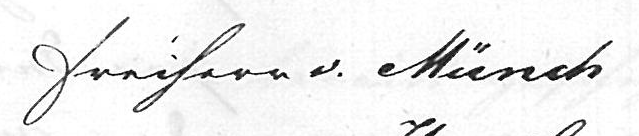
Freiherr v. Münch
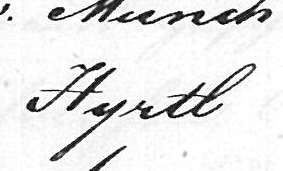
Hyrtl
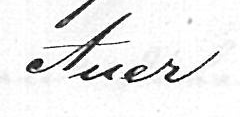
Auer
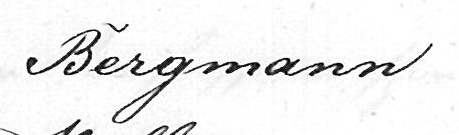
Bergmann
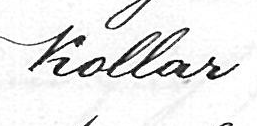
Kollar
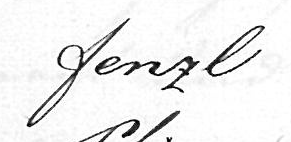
Fenzl
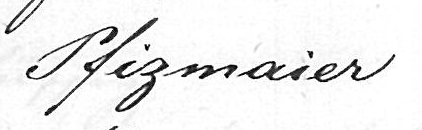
Pfizmaier
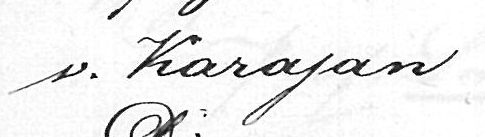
v. Karajan
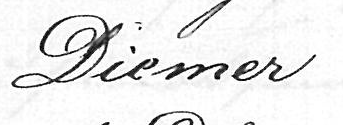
Diemer
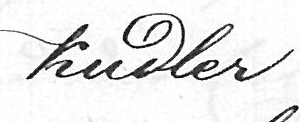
Kudler
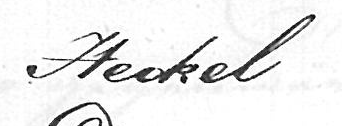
Heckel
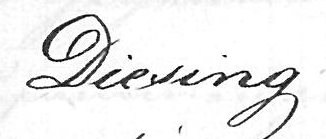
Diesing
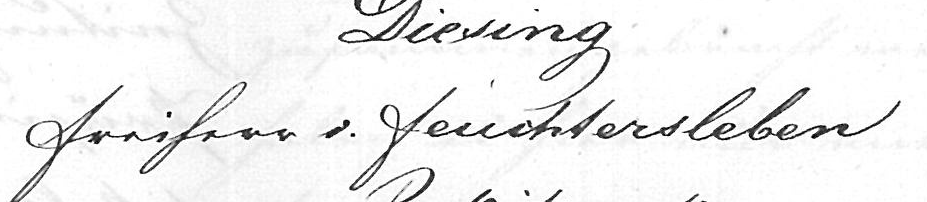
Freiherr v. Feuchtersleben
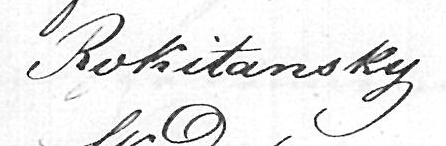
Rokitansky
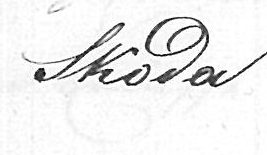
Skoda
